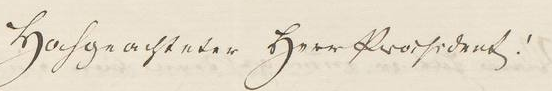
Hochgeachteter Herr Präsident!
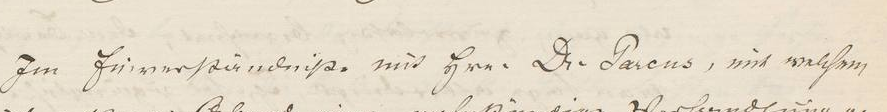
Im Einverständniße mit Hrn. Dr. Parcus, mit welchem
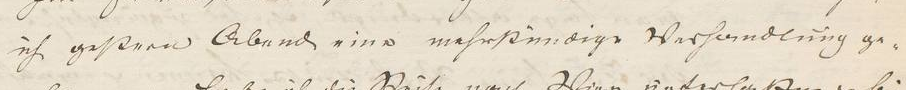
ich gestern Abend eine mehrstündige Verhandlung ge-
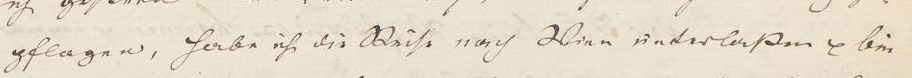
pflogen, habe ich die Reise nach Wien unterlaßen & bin
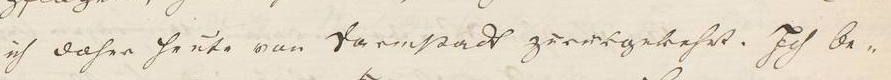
ich daher heute von Darmstadt zurükgekehrt. Ich be-
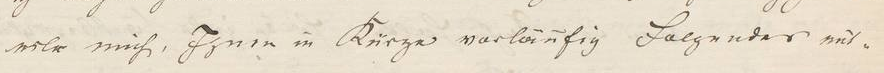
eile mich, Ihnen in Kürze vorläufig Folgendes mit-
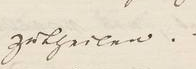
zutheilen. –
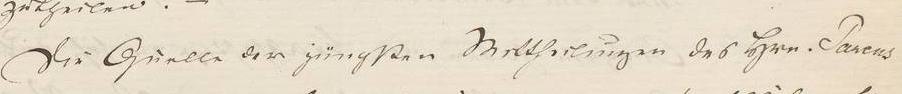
Die Quelle der jüngsten Mittheilungen des Hrn. Parcus
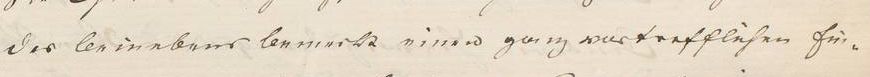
der beinebens bemerkt einen ganz vortrefflichen Ein-
